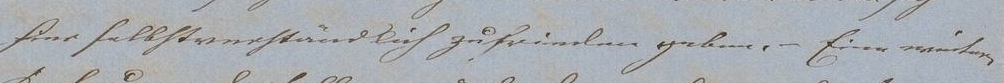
hier selbstverständlich zufrieden geben. – Eine weitere
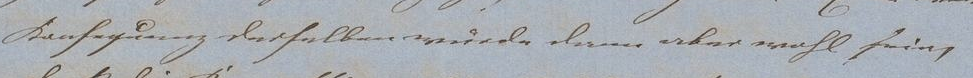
Konsequenz derselben würde dann aber wohl sein,
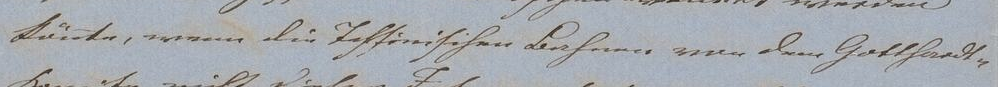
könnte, wenn die Tessinischen Bahnen, von dem Gotthardt -
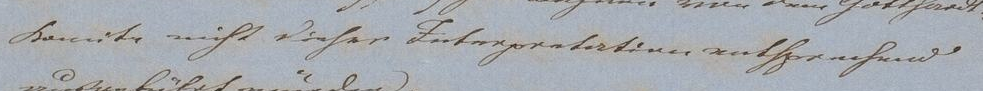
komite nicht dieser Interpretation entsprechend
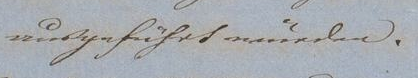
ausgeführt würden.
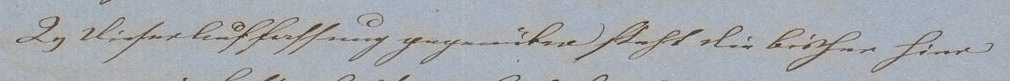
2.) Dieser Auffassung gegenüber steht die bisher hier
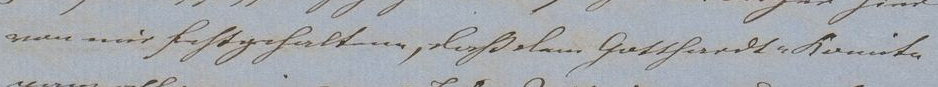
von mir festgehaltene, daß dem Gotthardt-Komite
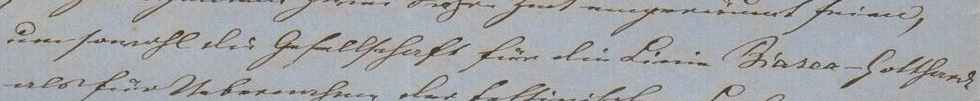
um sowohl die Gesellschaft für die Linie Biasca –Gotthardt
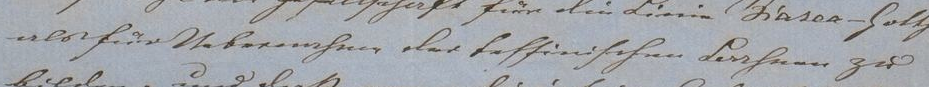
als für Uebernahme der tessinischen Bahnen zu
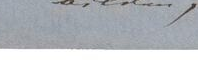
Gesellschaft
